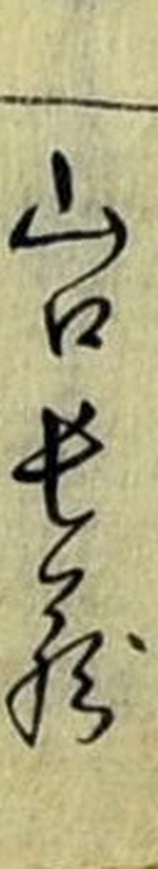山口長蔵
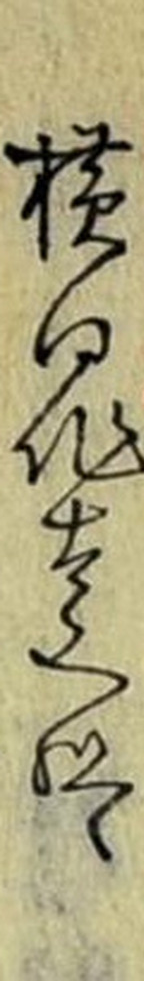横田作太夫組へ
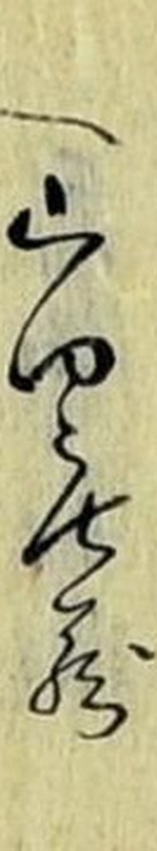山田庄蔵
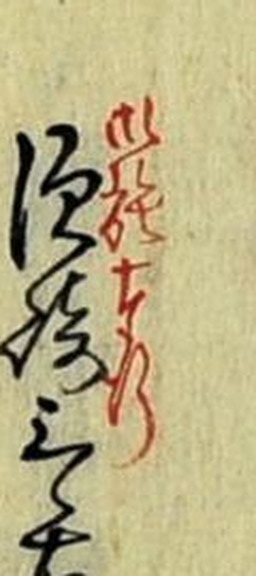御旗奉行
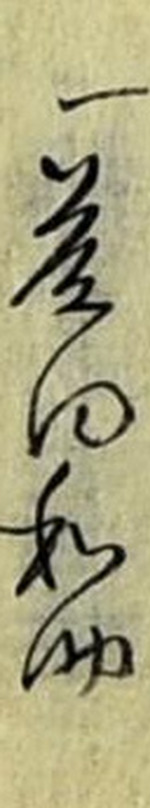藤田和助
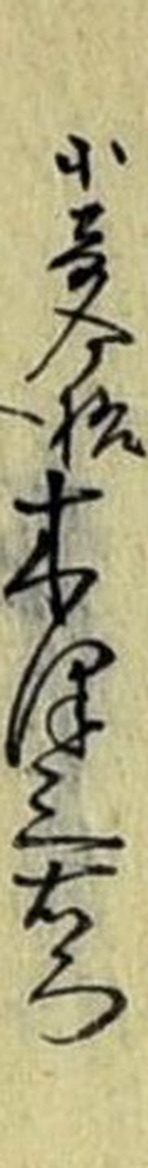小寄合格木澤三右衛門
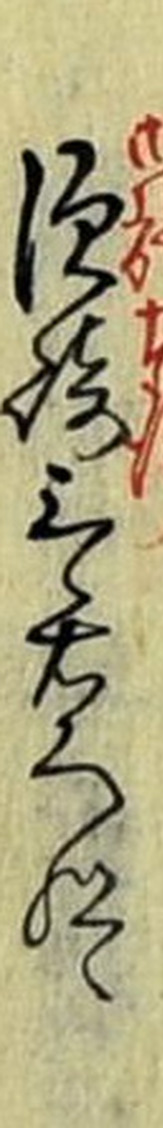須崎三郎右衛門組へ
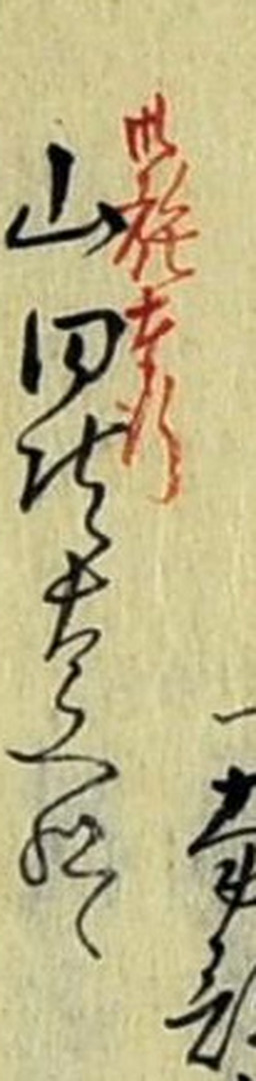山田次郎太夫組へ
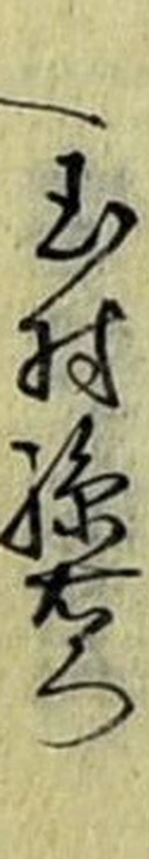玉村孫右衛門
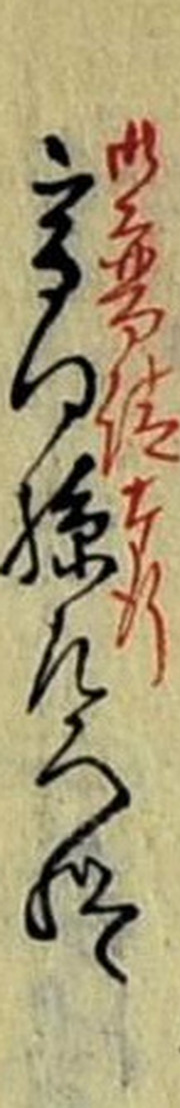髙田孫左衛門組へ
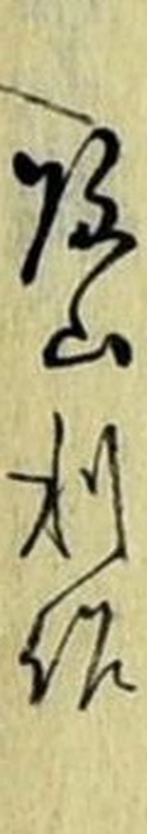飯山利作
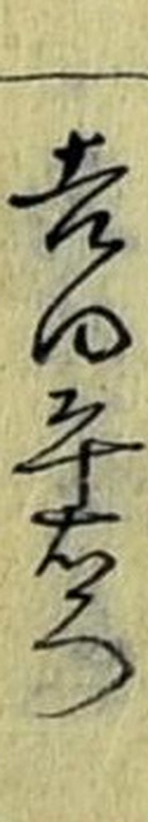吉田平右衛門
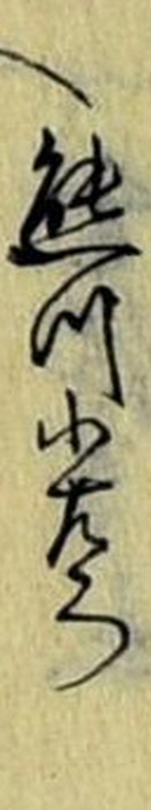熊川小左衛門
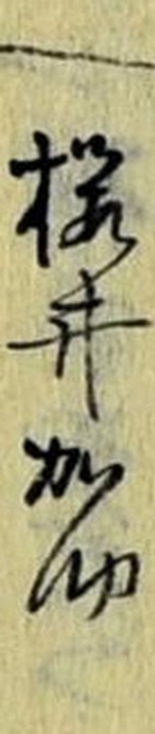桜井加助
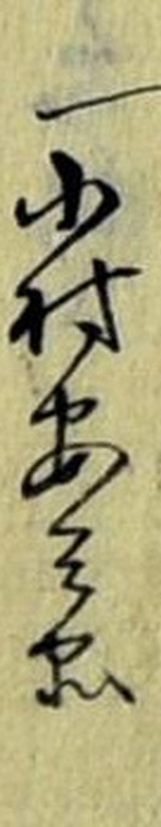小村安兵衛

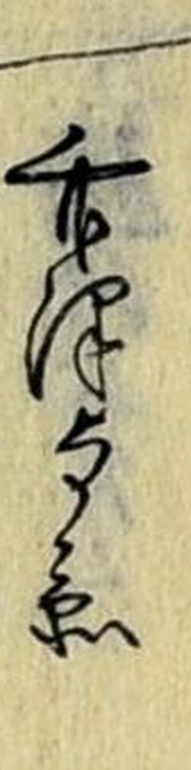竹沢与兵衛
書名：命令之部 四
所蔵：福井県文書館 Fukui Prefectural Archives
